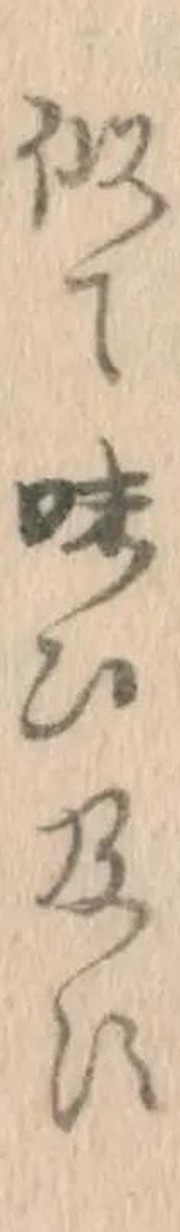似て味ひ及す
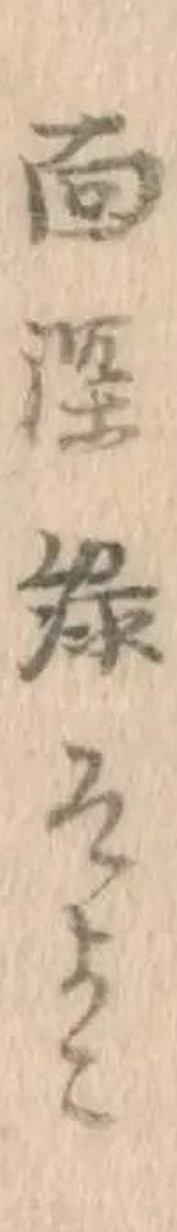面深緑そよこ
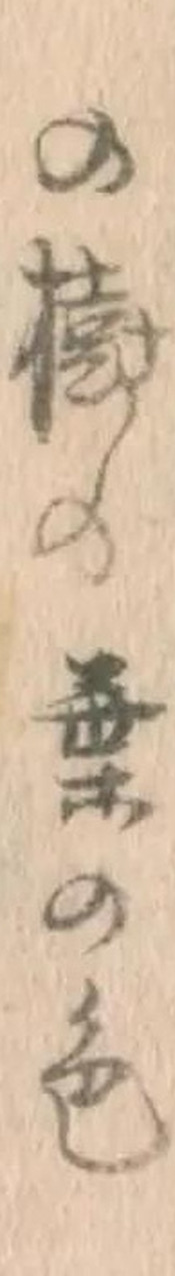の樹の葉の色
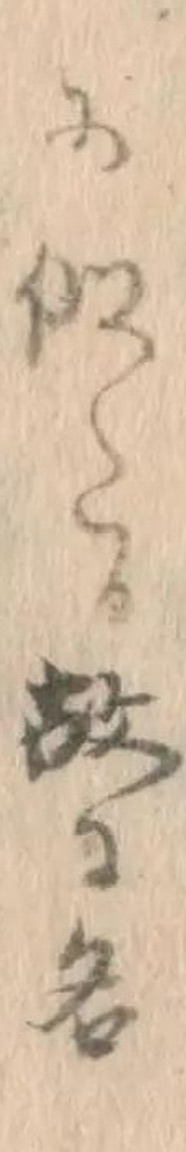に似たる故に名
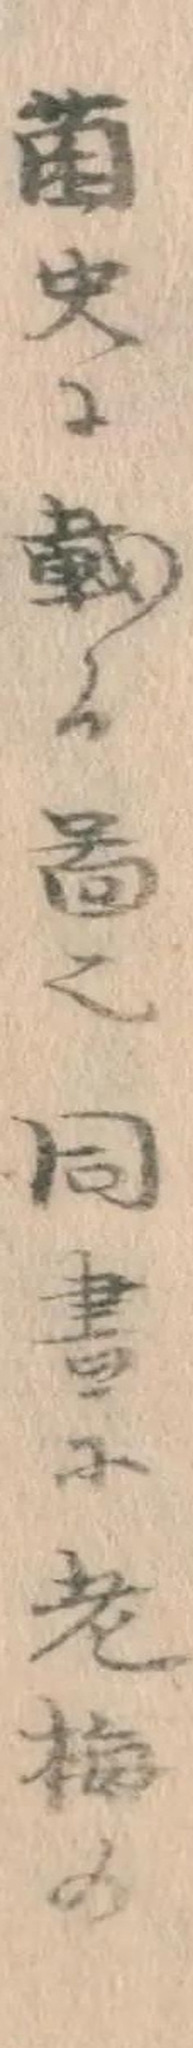菌史に載る図也同書に老梅の
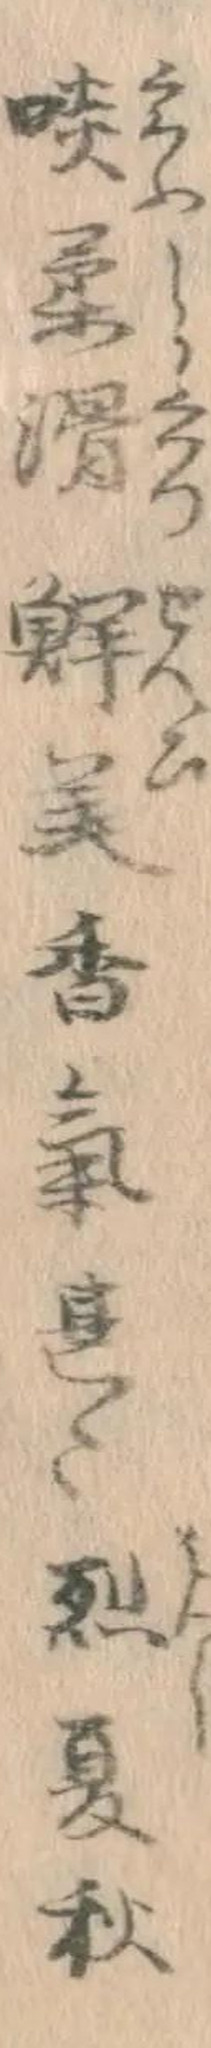啖柔滑鮮美香気甚た烈夏秋
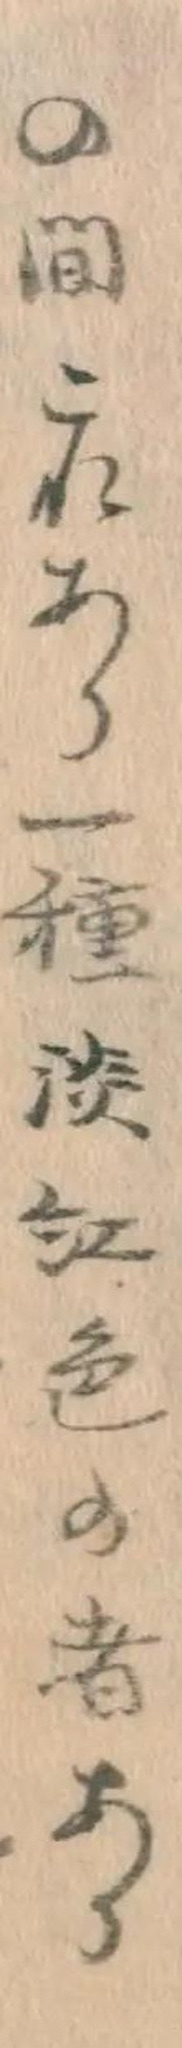の間これあり一種淡紅色の者あり
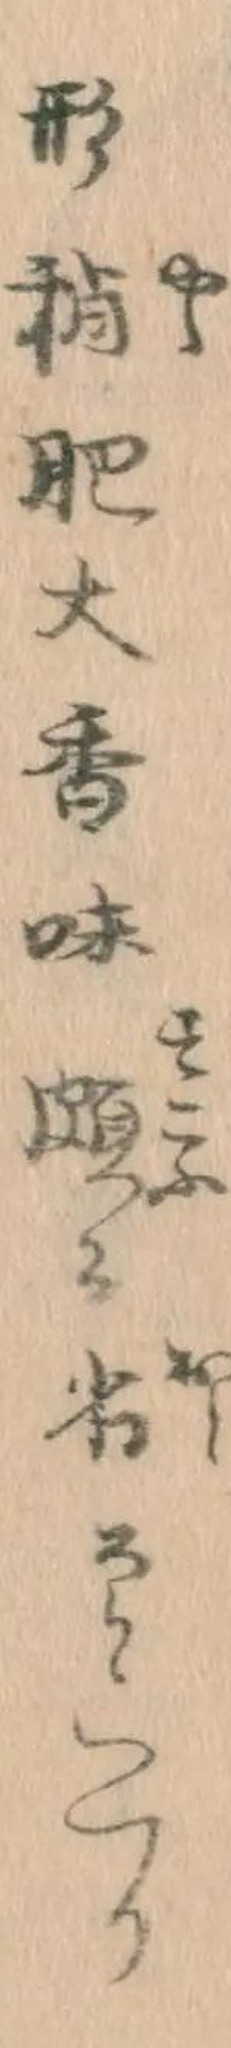形稍肥大香味頗る劣ろといへり
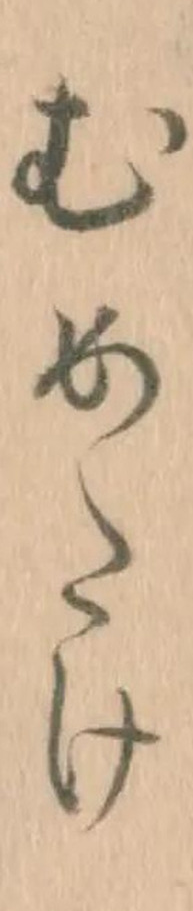むめたけ
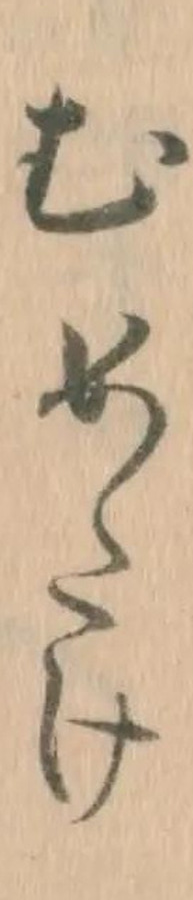むめたけ
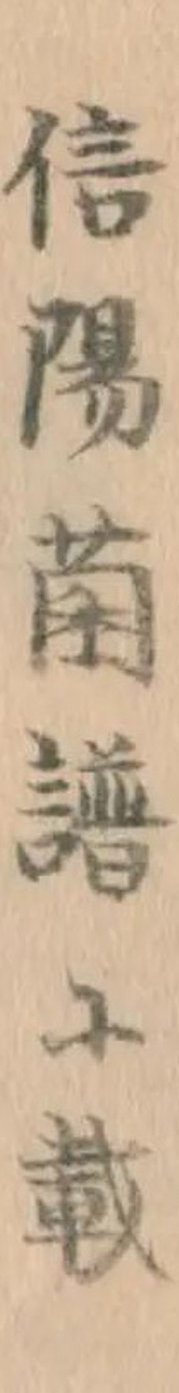信陽菌譜に載
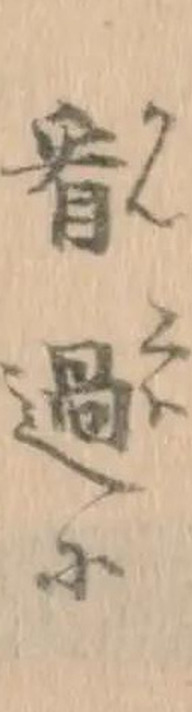看過に
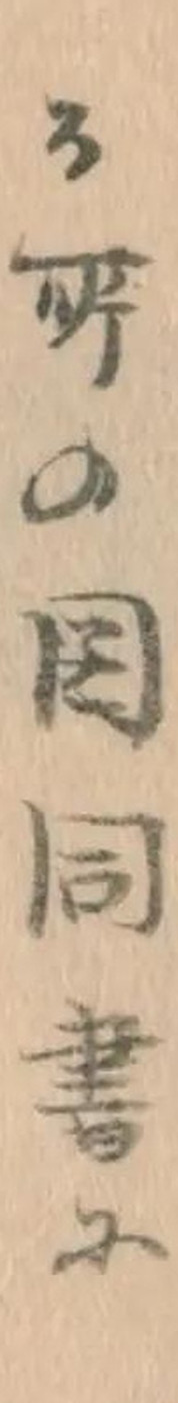る所の図同書に
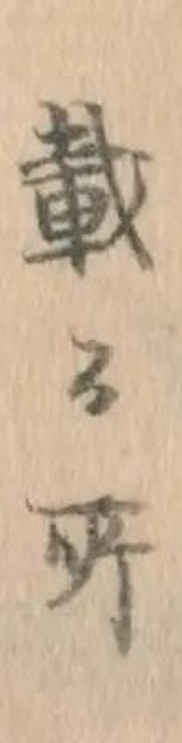載る所
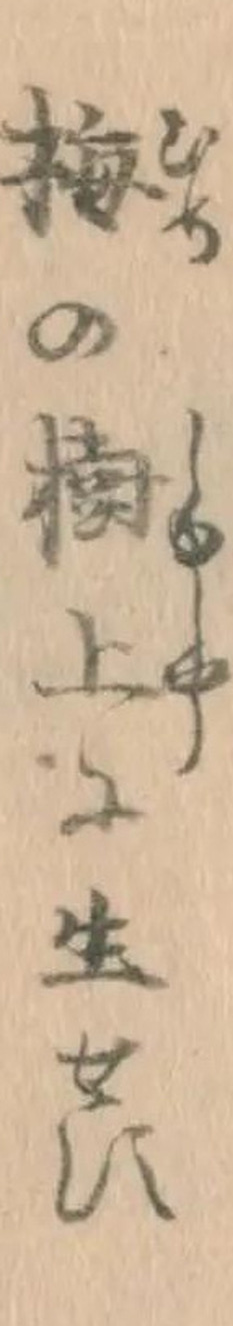梅の樹上に生せす
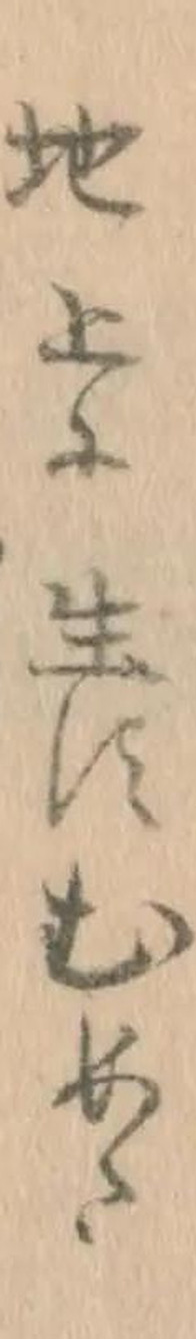地上に生すむめた
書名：本草図譜. 巻55-57
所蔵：国立国会図書館 National Diet Library, JAPAN
